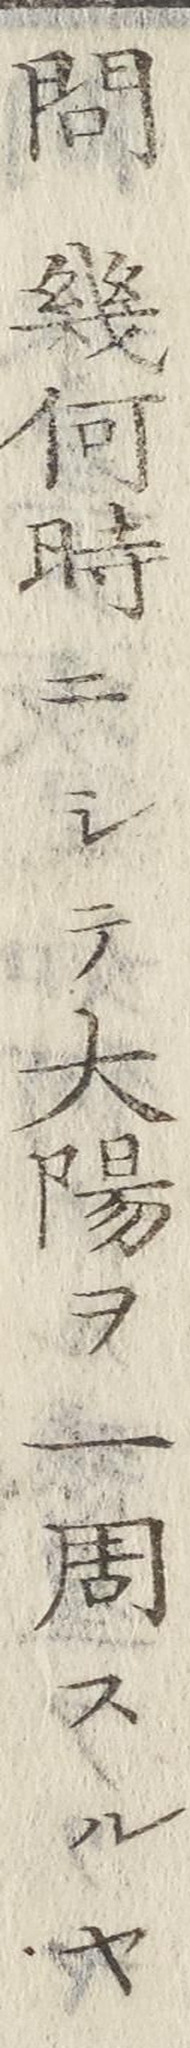問幾何時ニシテ大陽ヲ一周スルヤ
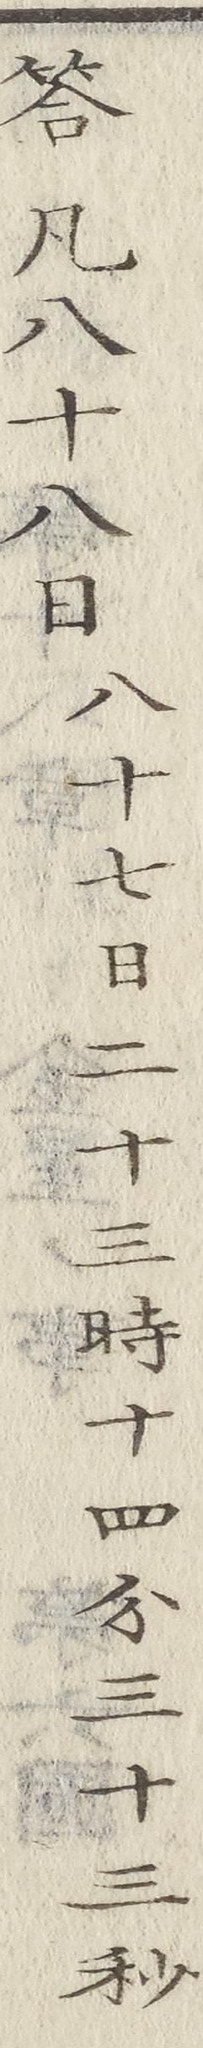答凡八十八日八十七日二十三時十四分三十三秒
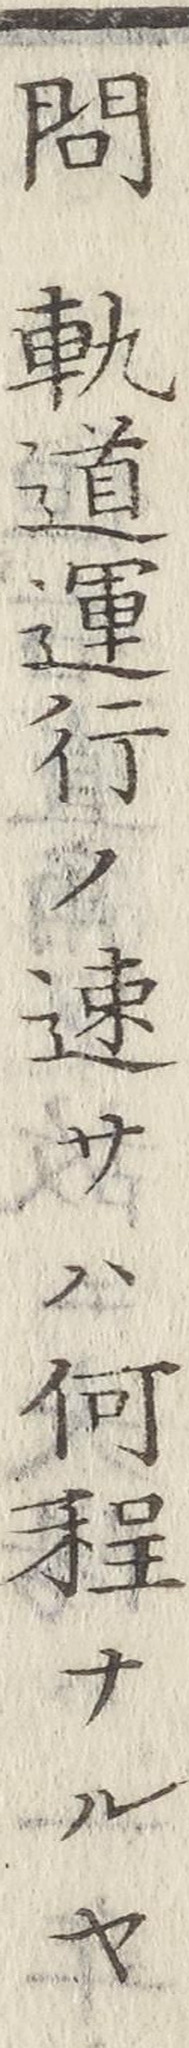問軌道運行ノ速サハ何程ナルヤ
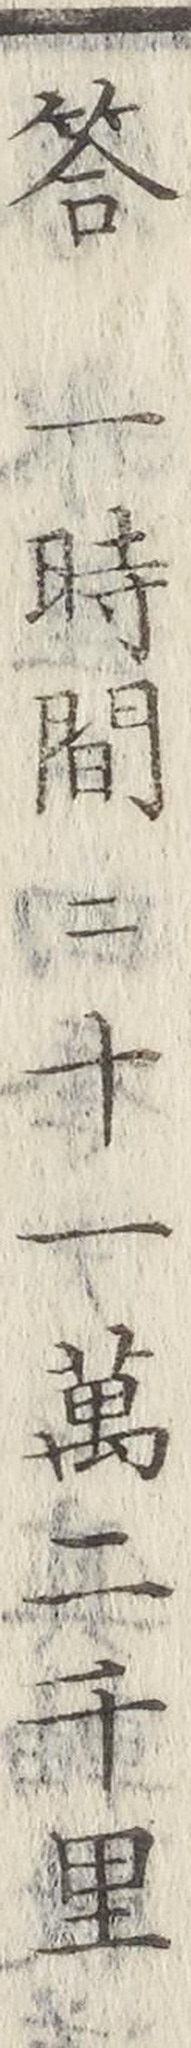答一時間ニ十一萬二千里
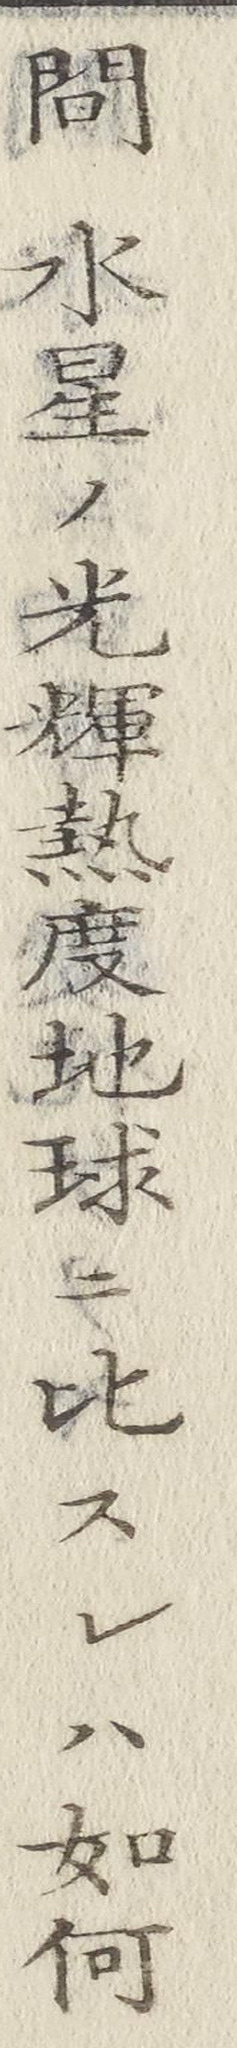問水星ノ光輝熱度地球ニ比スレハ如何
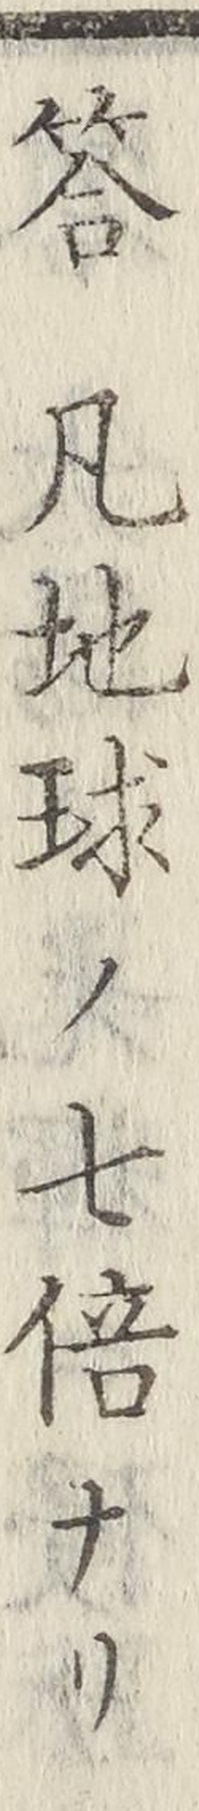答凡地球ノ七倍ナリ
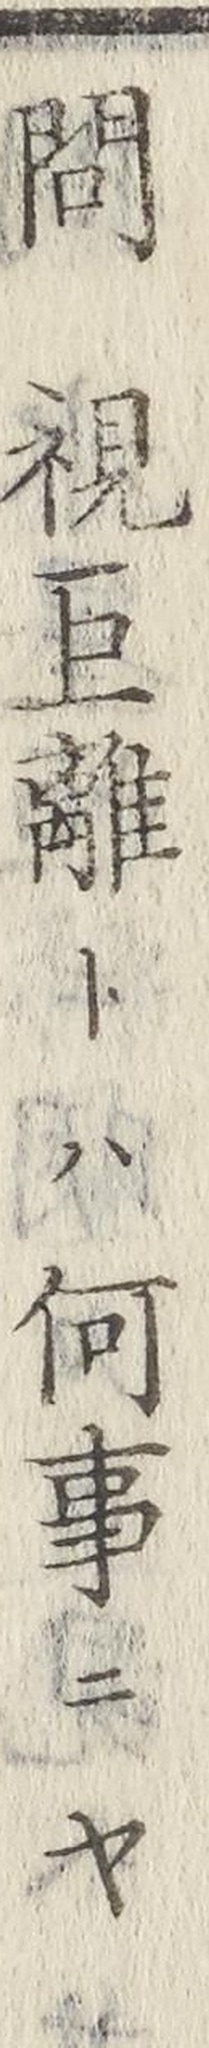問視巨離トハ何事ニヤ
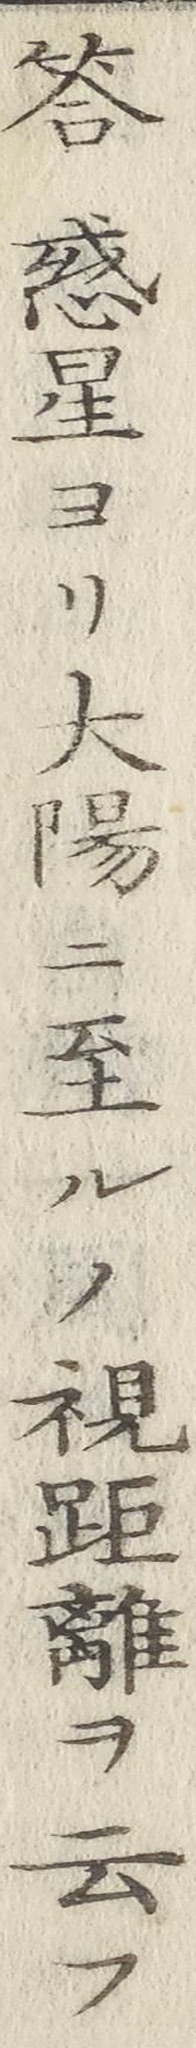答惑星ヨリ大陽ニ至ルノ視巨離ヲ云フ
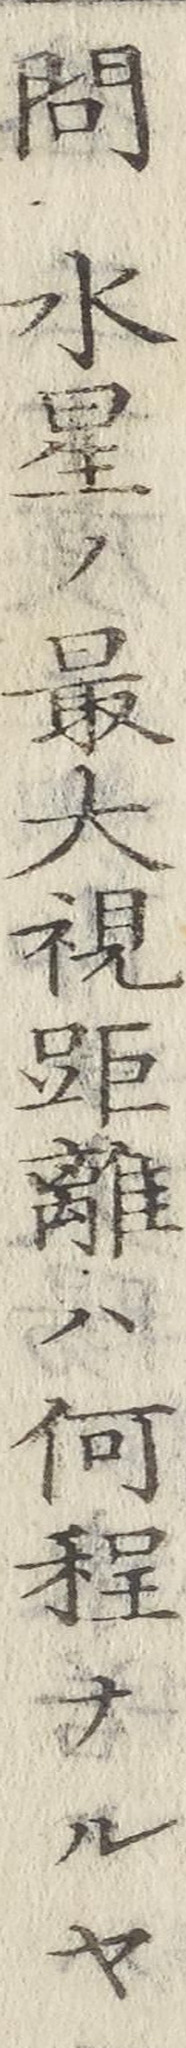問水星ノ最大視距離ハ何程ナルヤ

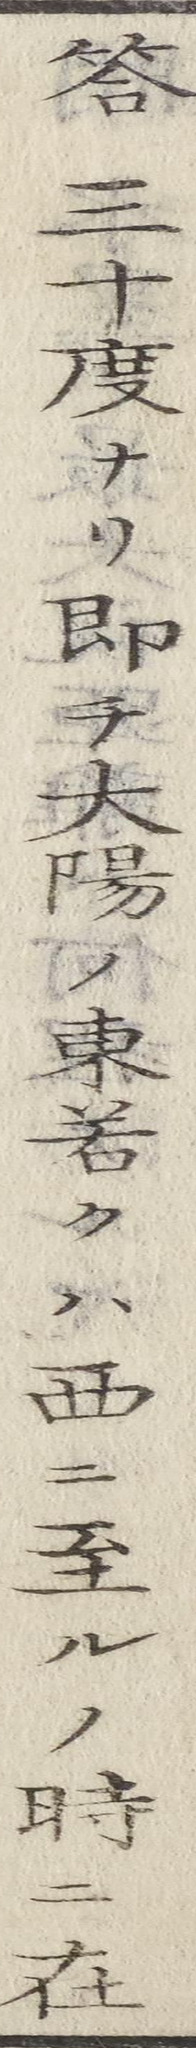答三十度ナリ即チ大陽ノ東若クハ西ニ至ルノ時ニ在
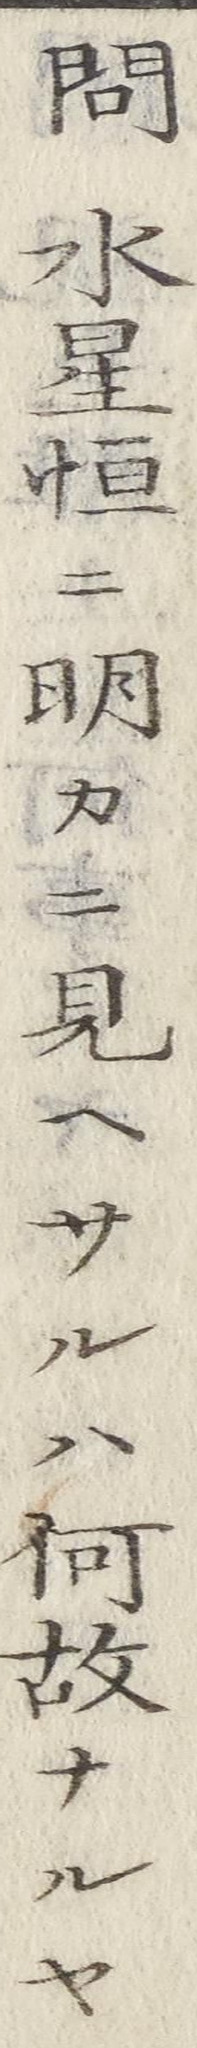問水星恒ニ明カニ見ヘサルハ何故ナルヤ
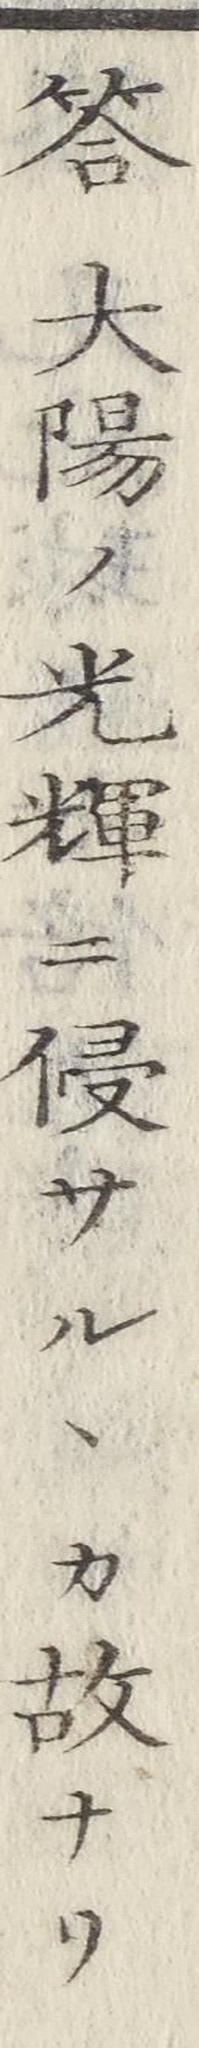答大陽ノ光輝ニ侵サルヽカ故ナリ
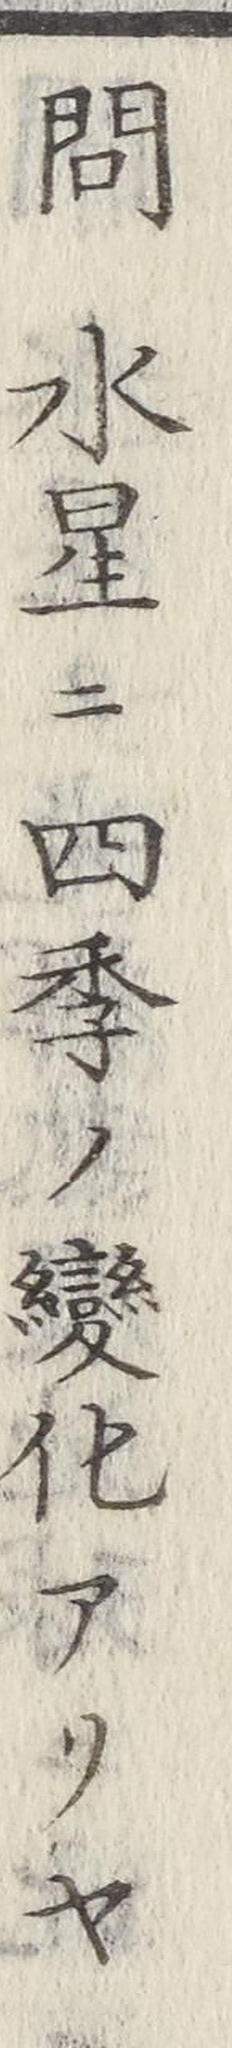問水星ニ四季ノ変化アリヤ
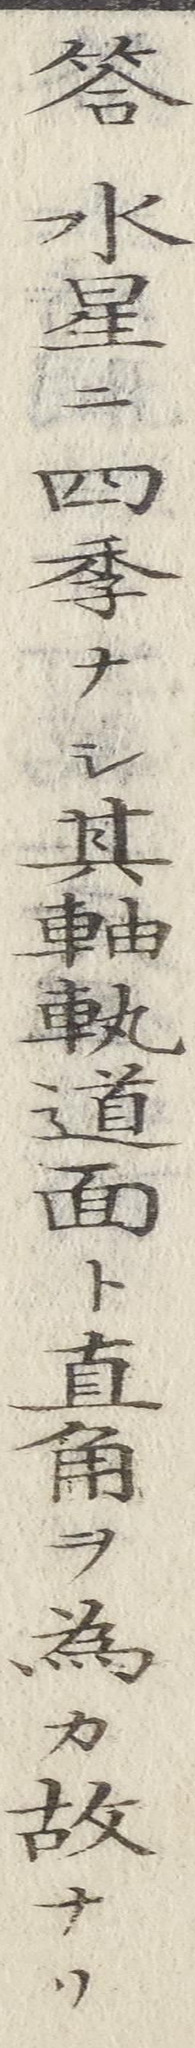答水星ニ四季ナシ其軸軌道面ト直角ヲ為カ故ナリ
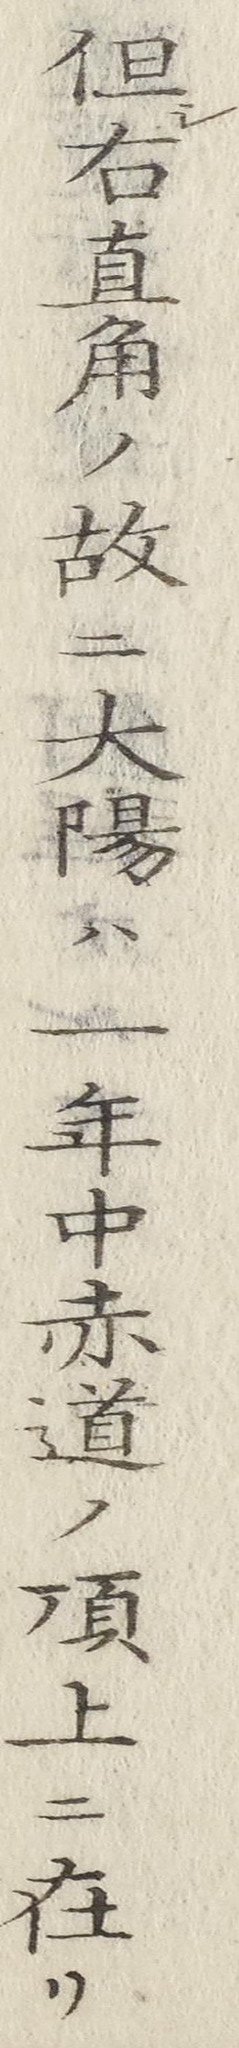但シ右直角ノ故ニ大陽ハ一年中赤道ノ頂上ニ在リ
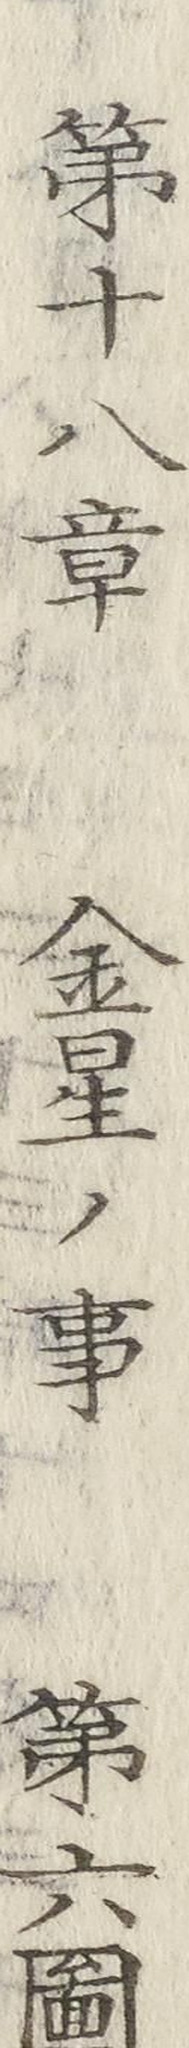第十八章金星ノ事第六図
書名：星学圖説　上
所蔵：東京大学地震研究所図書室 Earthquake Research Institute Library, The University of Tokyo, JAPAN
